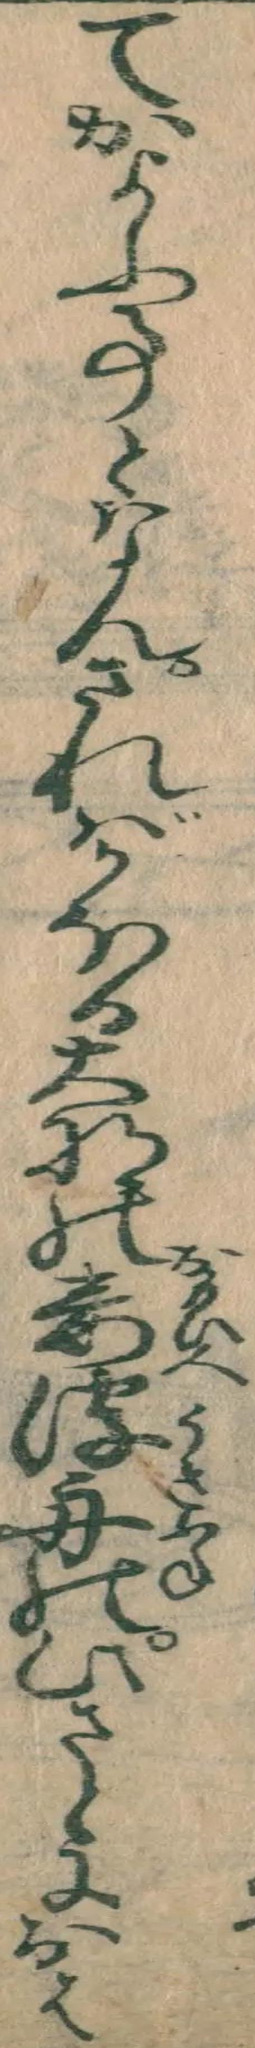てかよふ事となん。さればかほる大将の妾浮舟の。此さとにおは
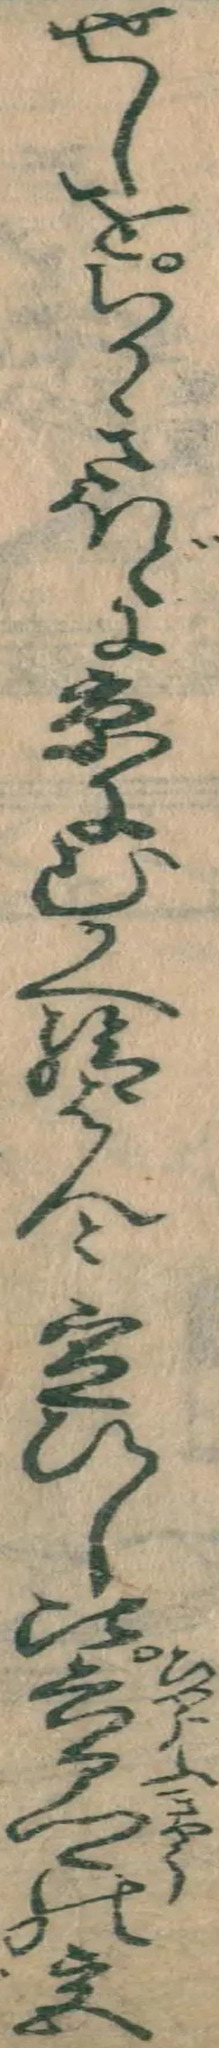せしを。ちかきほどに京にむかへ給はんと宣ひし比。兵部卿郷の宮
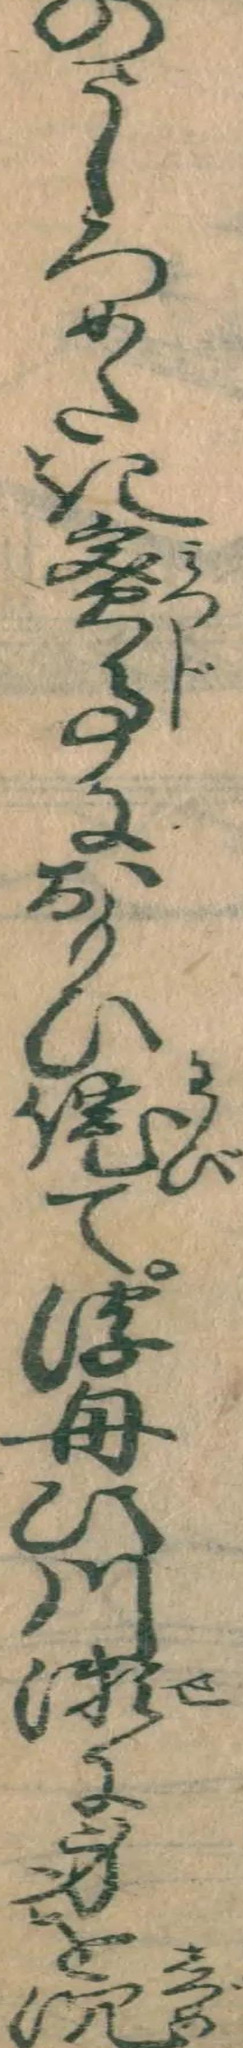のうしろめたき蜜事におもひ侘て。浮舟此川瀬に身を沈

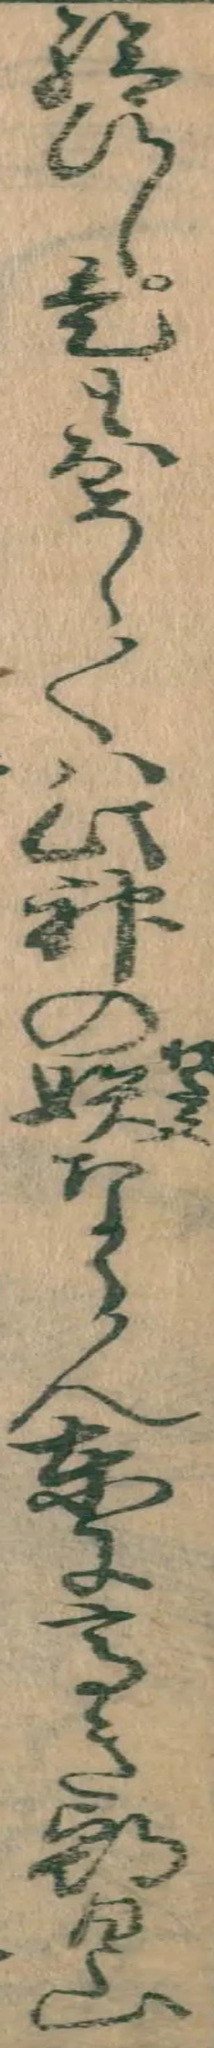給ひし。是もおそら〱は此神の嫉ならん東に高き朝日山
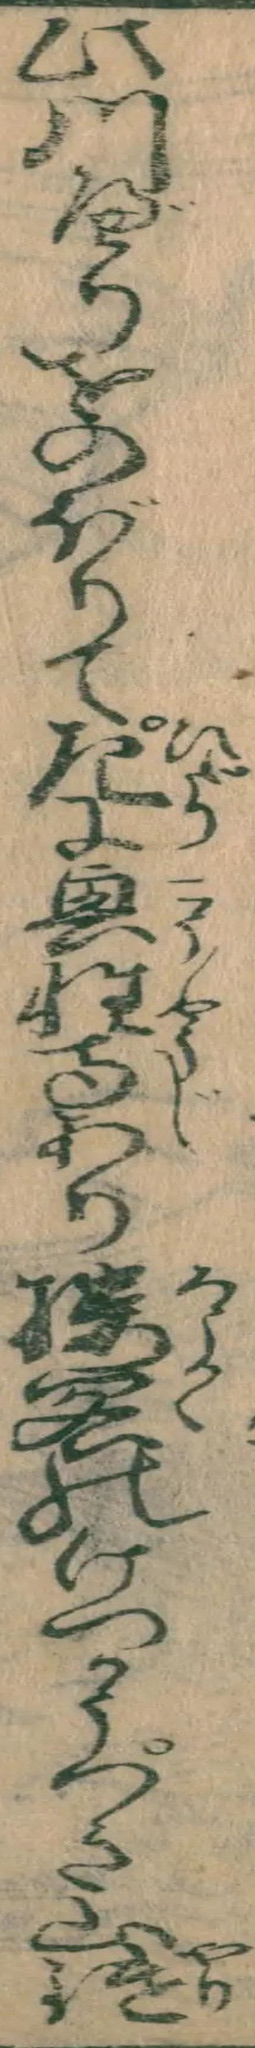此川べりをのぼりて。左に興性寺あり楼閣のけつかう。つき山鑓
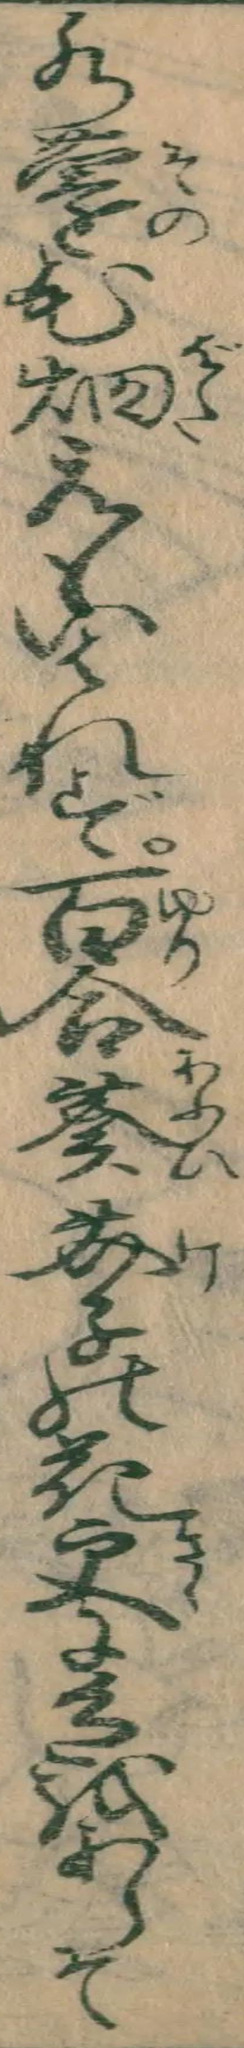水園花畑えもいはれず。百合葵芥子の花更に色をあらそ
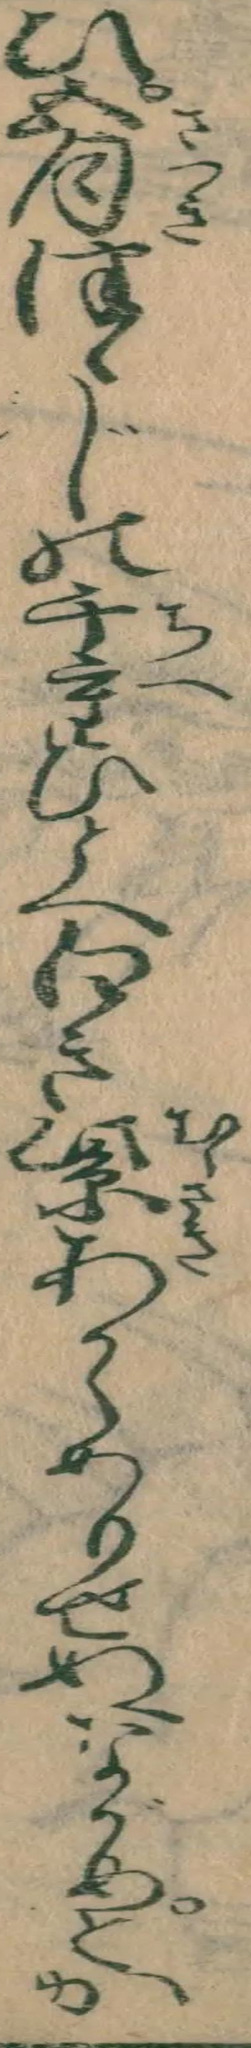ひ。五月つゝじの千重ひとへ白き紫あからめもせぬながめ。とか
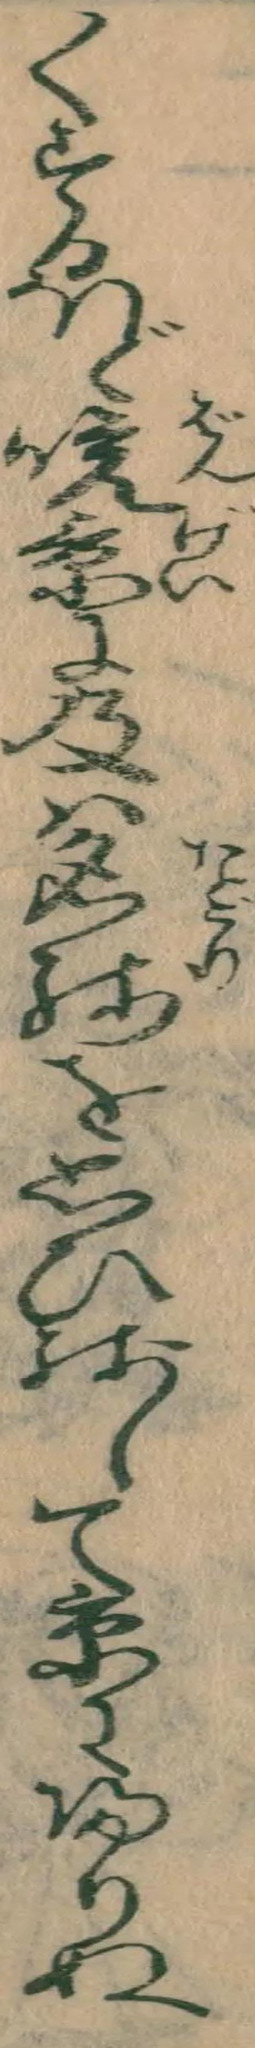〱するほど晩景に及は名残を思ひ残して京に帰りぬ
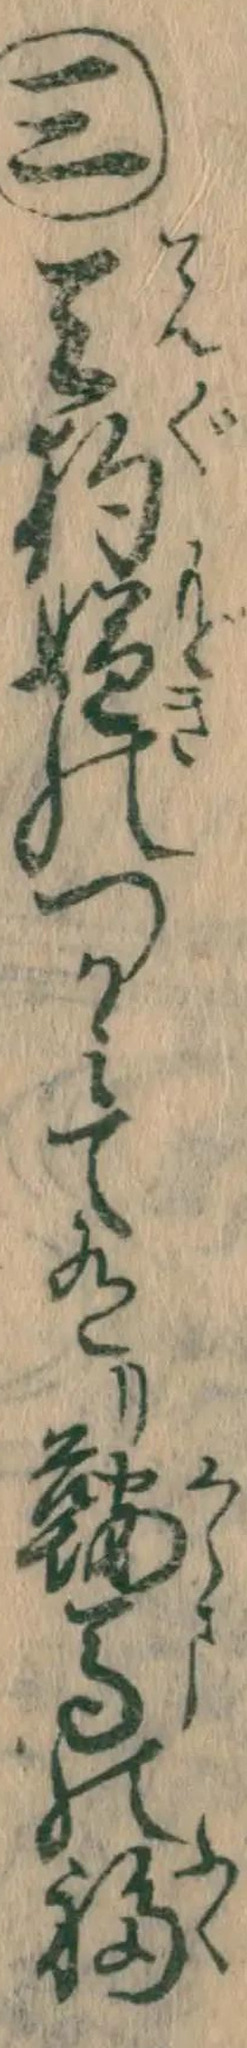三天狗のつかみて有り鞍馬の福
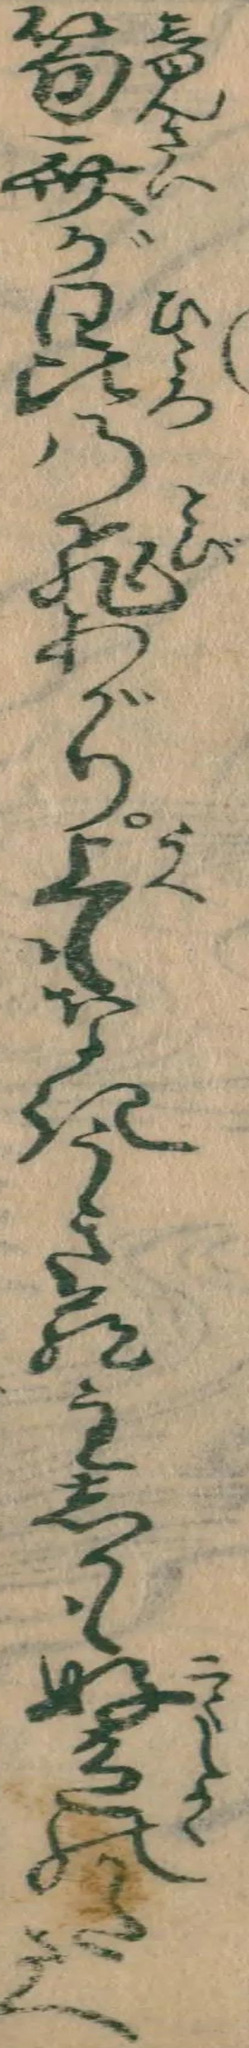筍斎が日比の飛あがり。上もなきうき蔵主しかも好色のかたさへ
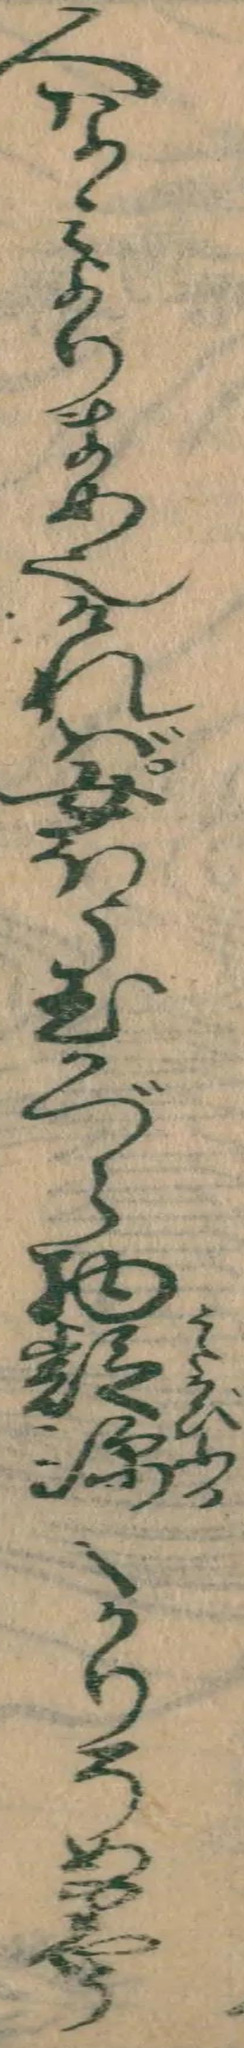人なみよりまめ也ければ。女ほう玉かづら物疑深くかりそめりやう
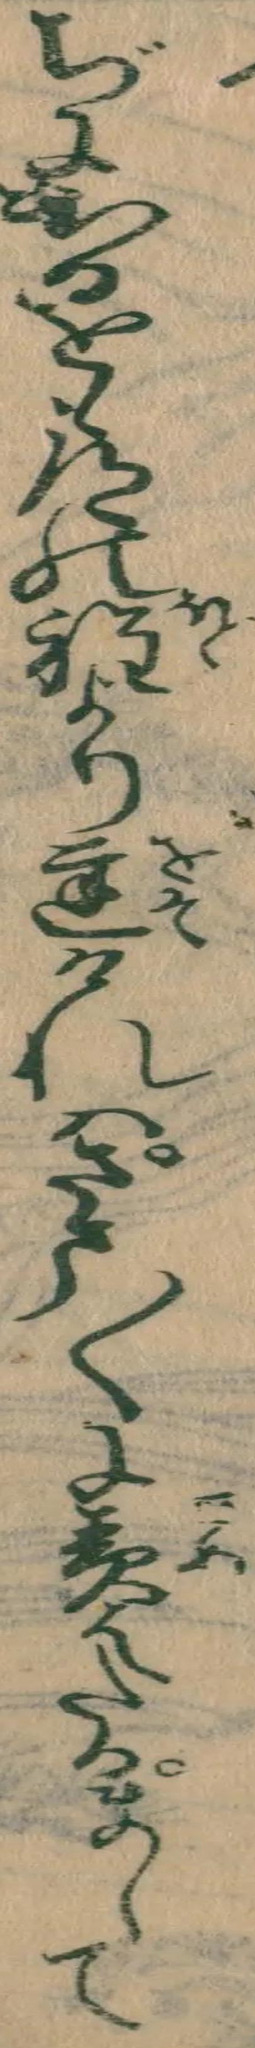ぢに出るをも道の程より遅けれは。さま〳〵に責はたる。まして
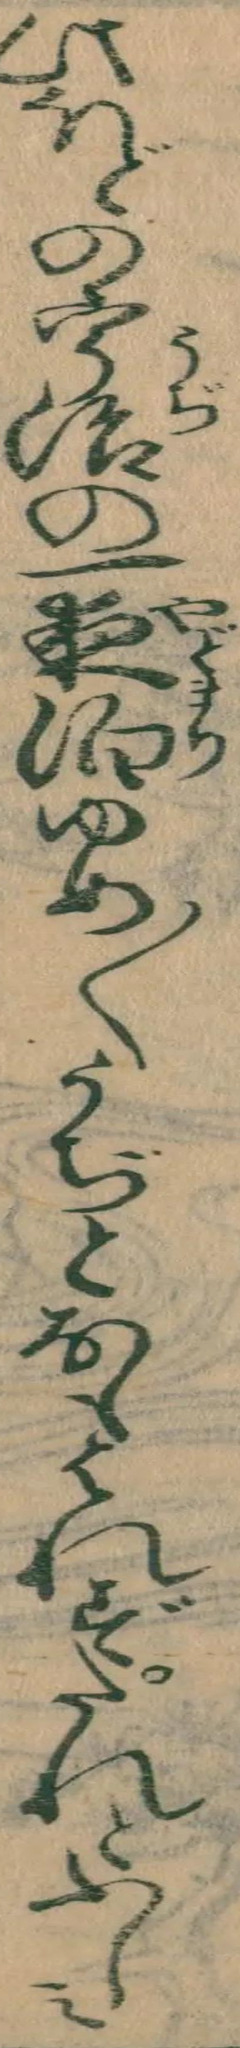此ほどの宇治の一夜泊ゆめ〳〵うぢとおもはれず。たれとふしみ
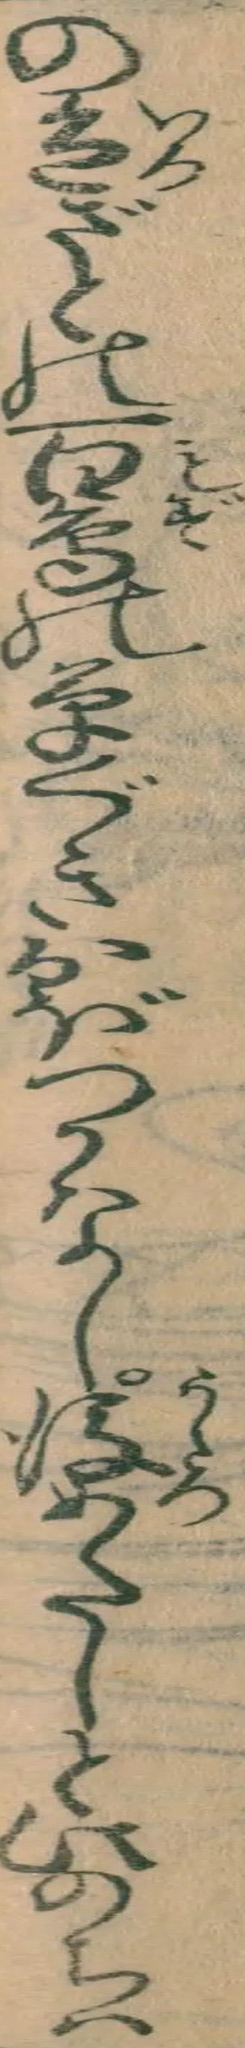の色ざとの百鳥の草ぐきおぼつかなし。後めたしと此のちは
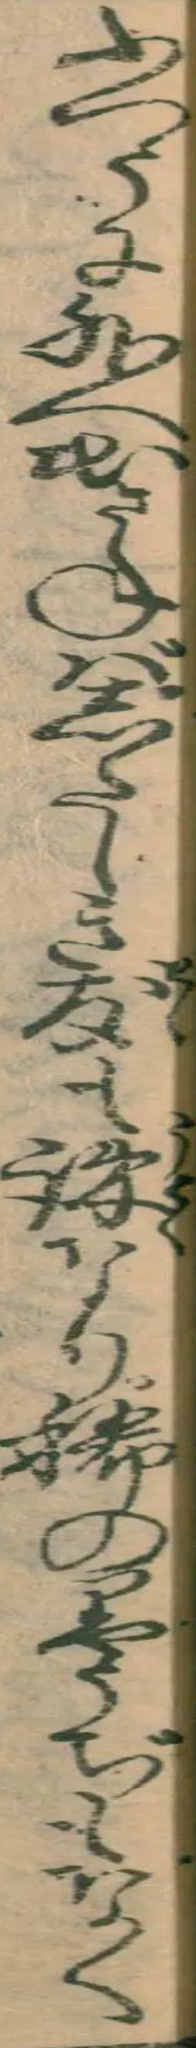ふつうに外へ出さねば。したしき友も疎なり。稀のりやうぢもなく
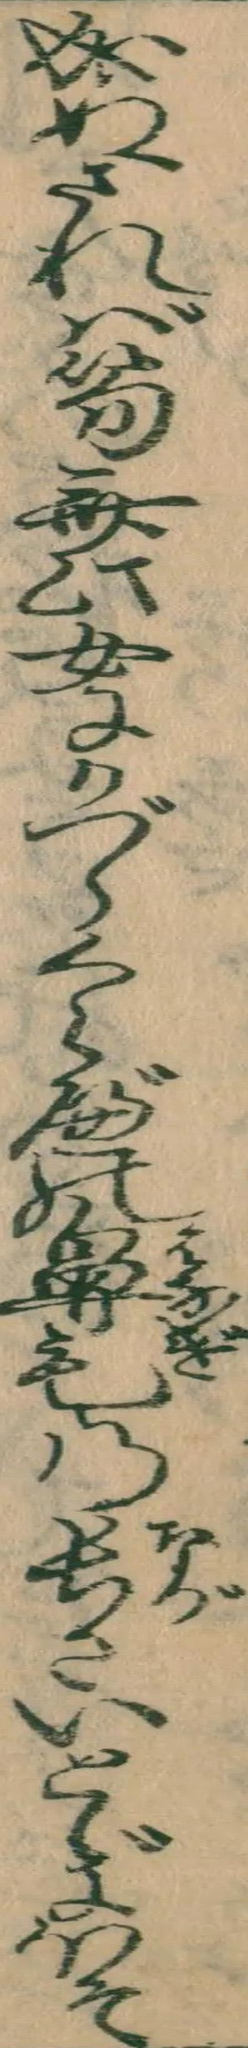成ぬされば筍斎此女にかづらくらべの鼻毛の長さいとゞにほそ
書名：新竹斎 5巻
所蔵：国立国会図書館 National Diet Library, JAPAN
